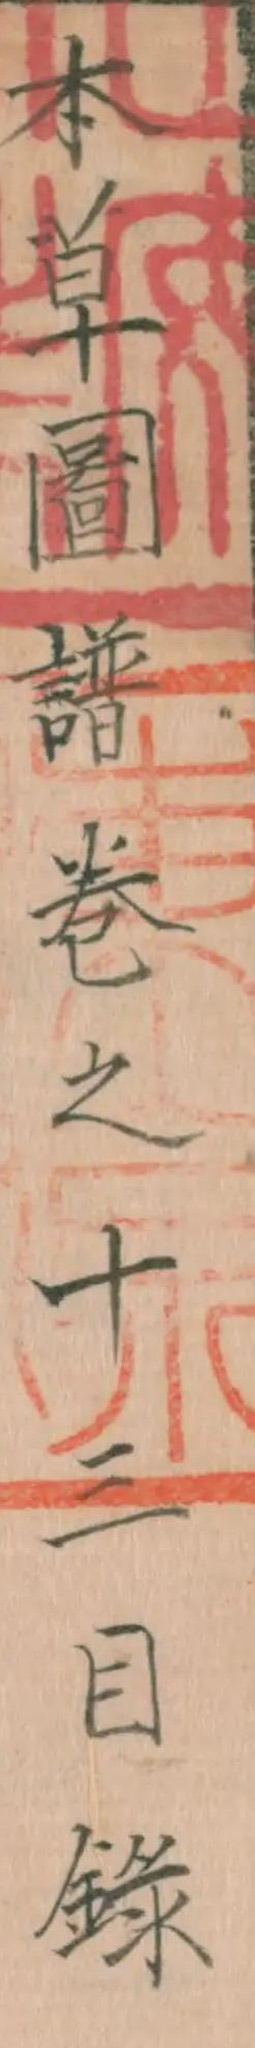本草図譜巻之十三目録
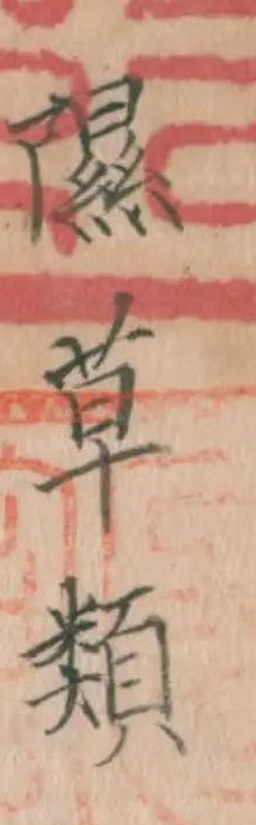隰草類

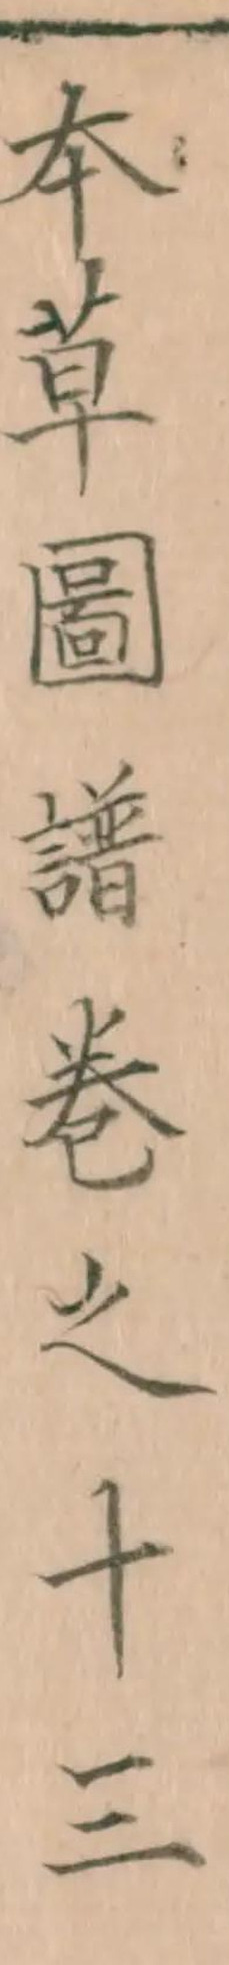本草図譜巻之十三
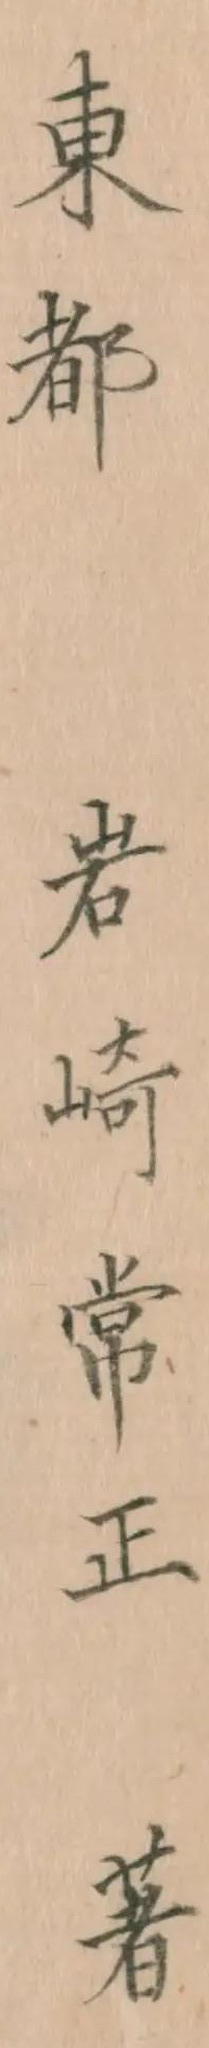東都岩崎常正著
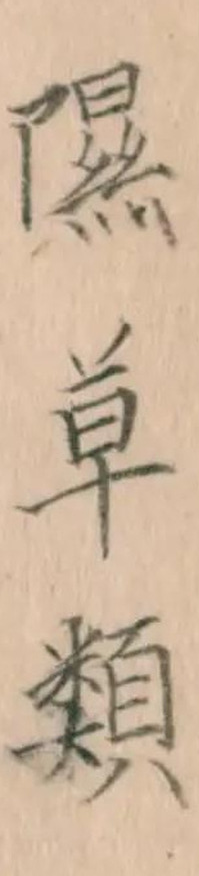隰草類

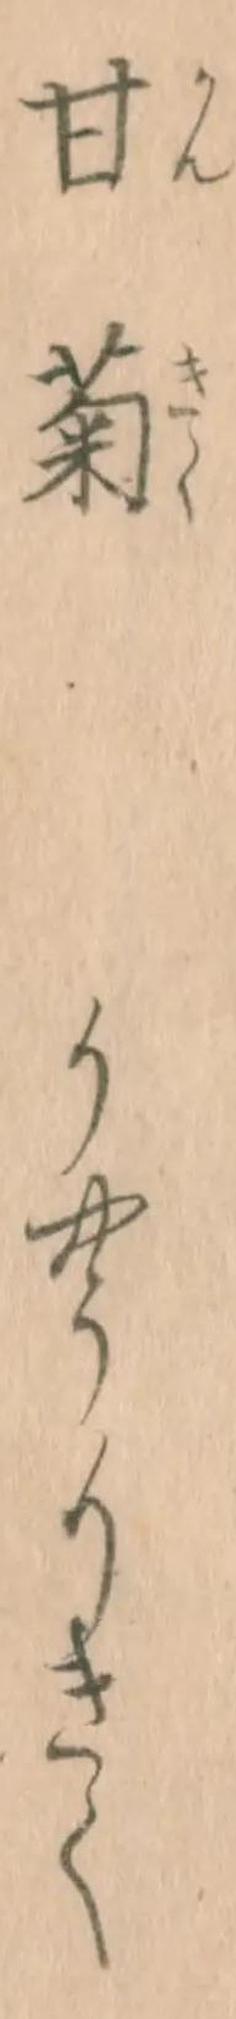甘菊りやうりきく
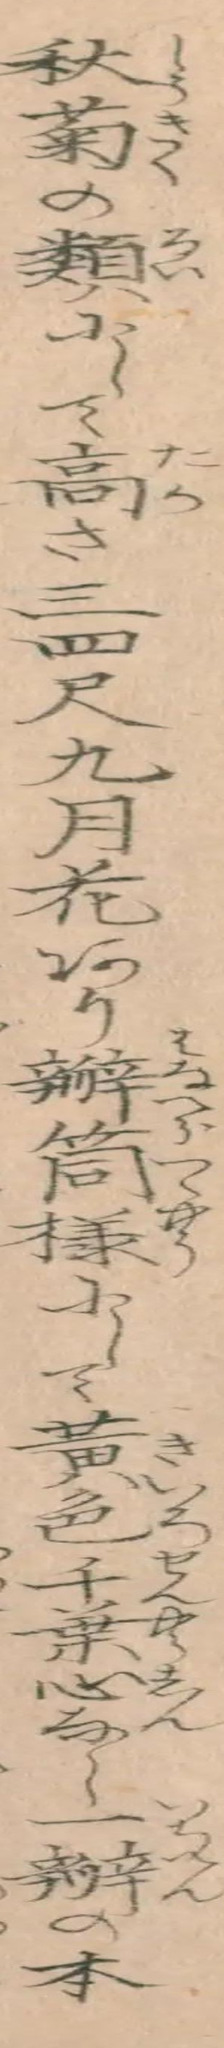秋菊の類にして高さ三四尺九月花あり瓣筒様にして黄色千葉心なし一瓣の本
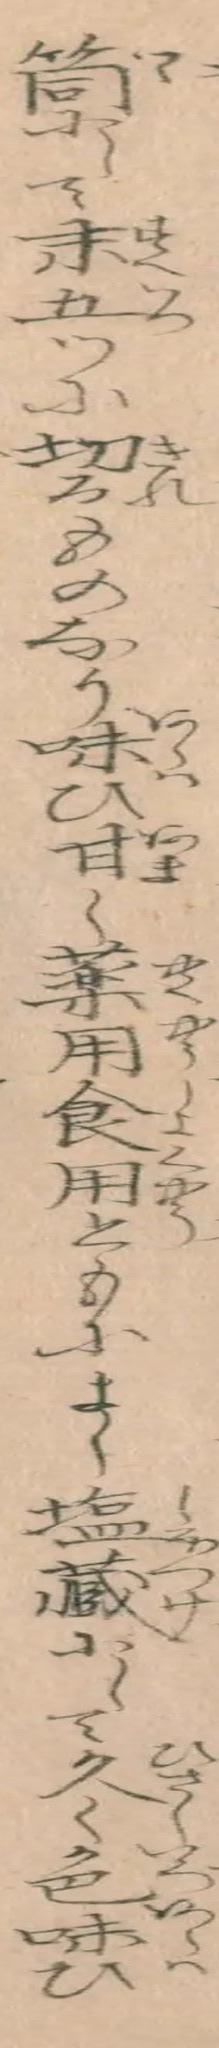筒にして末五ツに切るものなり味ひ甘し薬用食用ともによし塩蔵にして久く色味ひ
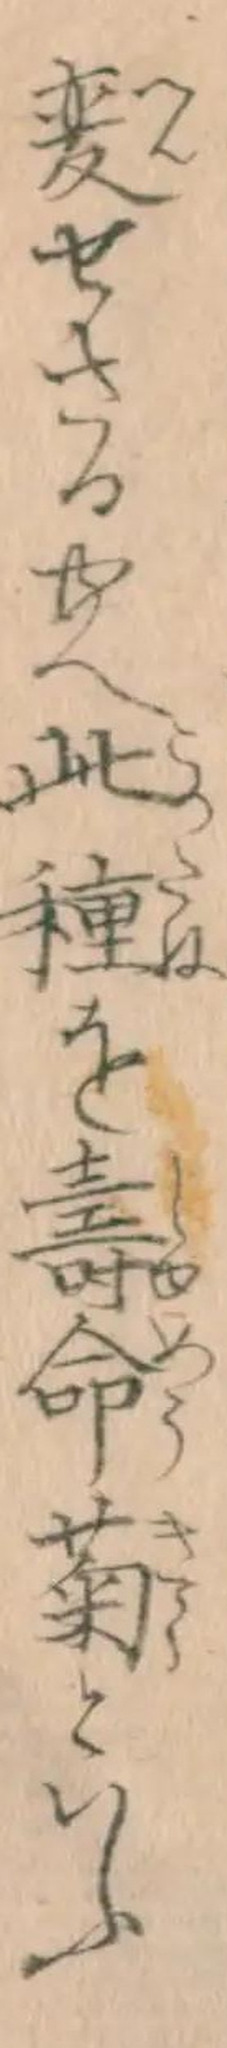変せさるゆへ此種を寿命菊といふ

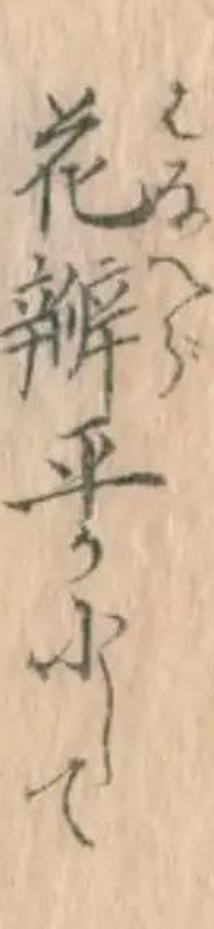花瓣平かにして
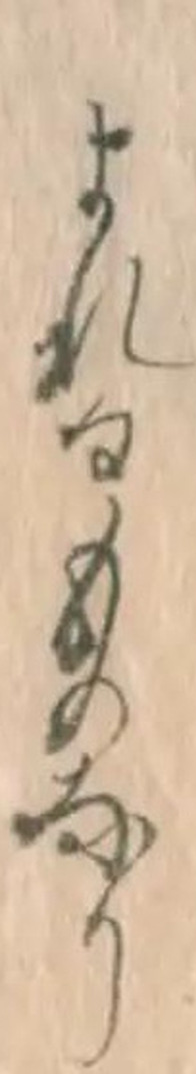よれるものなり
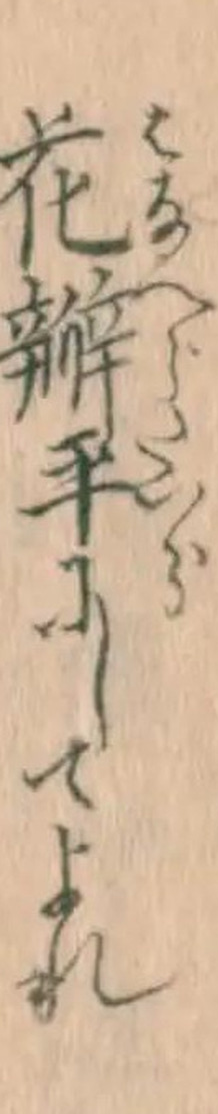花瓣平にしてよれ
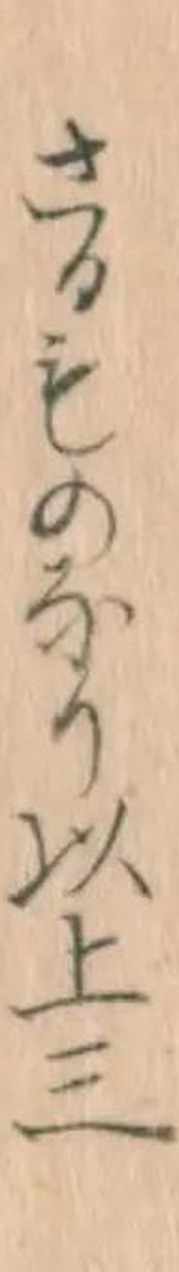さるものなり以上三
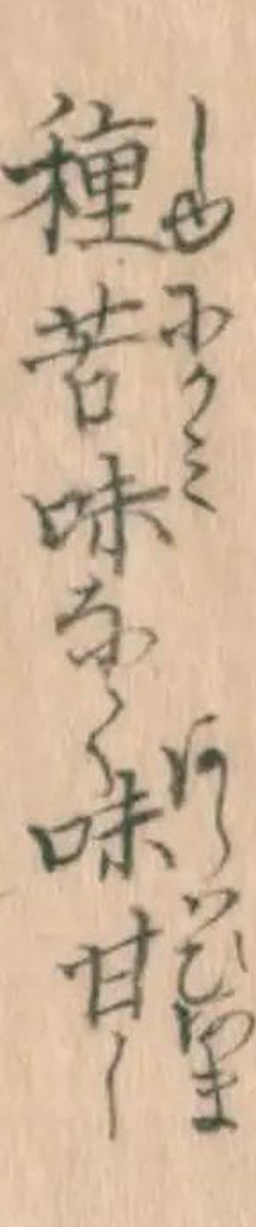種苦味なく味甘し
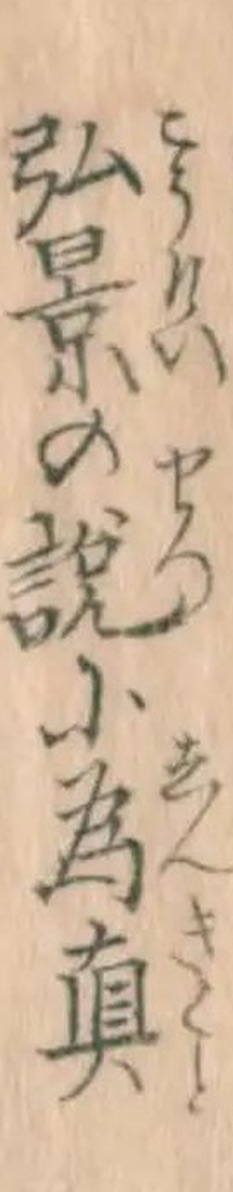弘景の説に為真
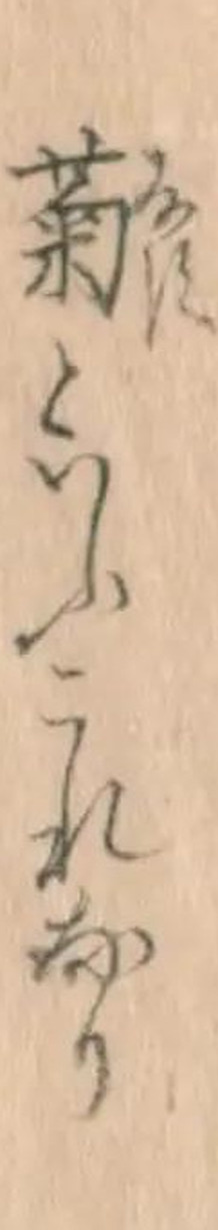菊といふこれなり
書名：本草図譜. 巻13-15
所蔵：国立国会図書館 National Diet Library, JAPAN
